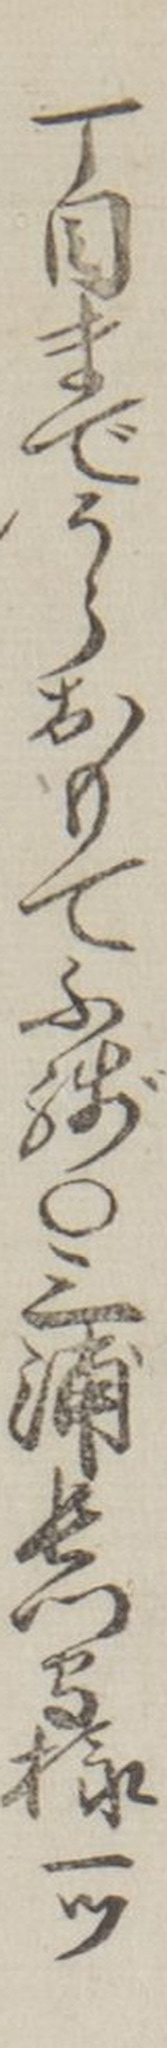丁目までうらおもて不残○三浦長門守様一ツ
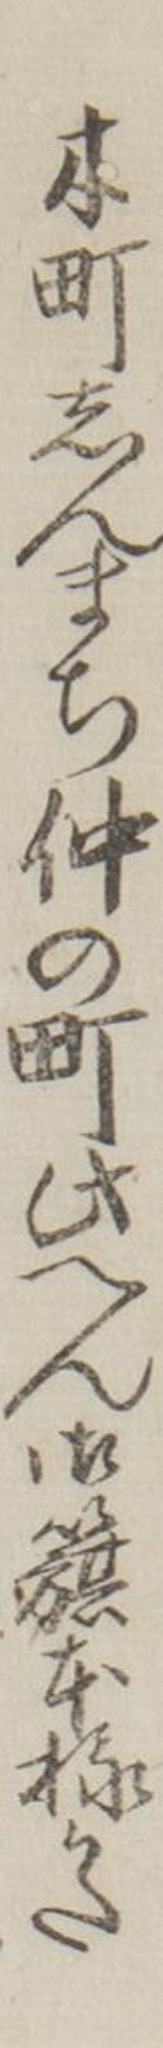木町しんまち仲の町此へん御簱本様かた
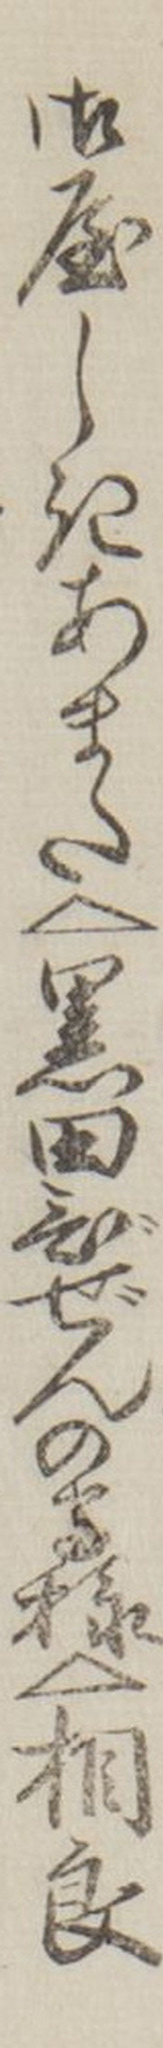御屋しきあまた△黒田びぜんの守様△相良
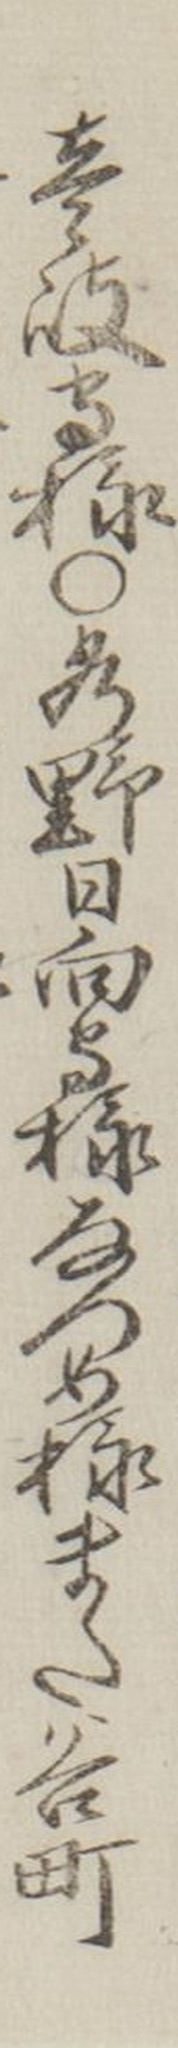壱岐守様○水野日向守様なつめ様また谷町
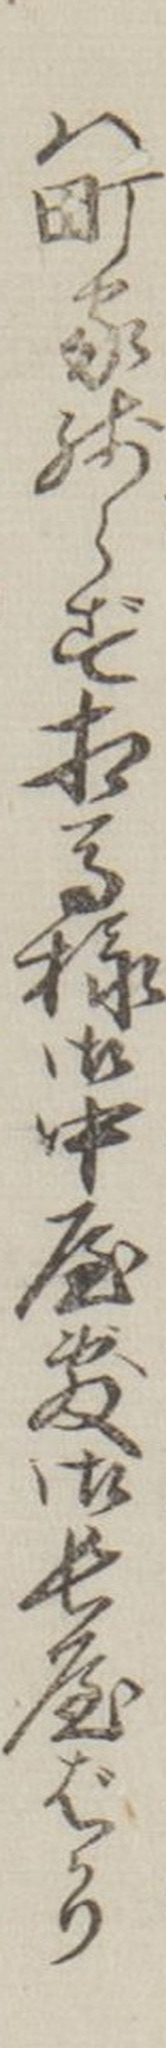八町家残らず相馬様御中屋敷御長屋ばかり
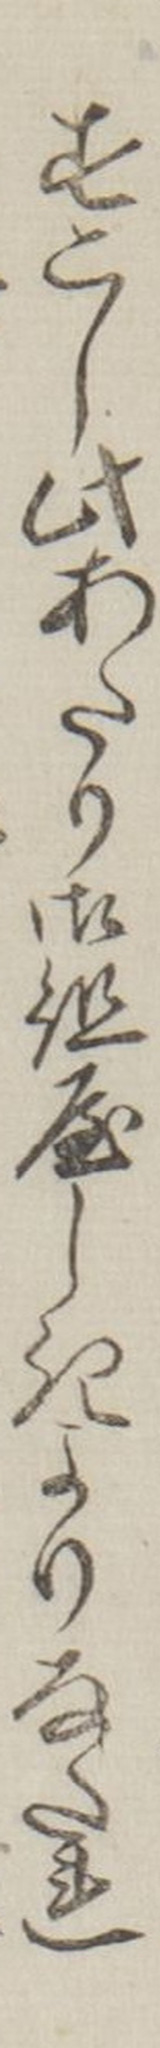すこし此あたり御組屋しきよりなたれ
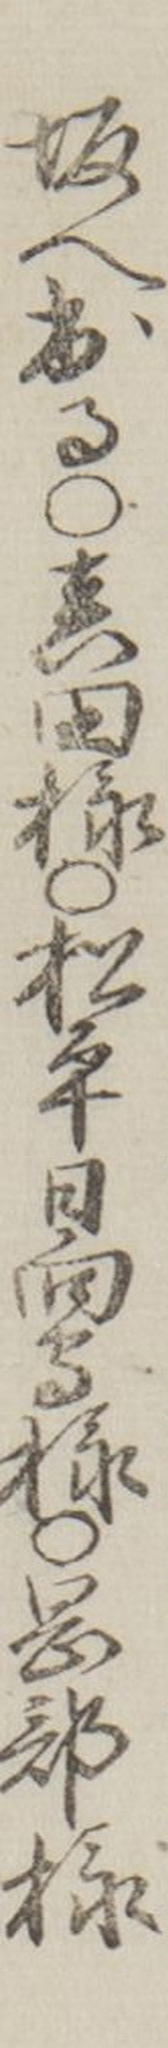坂へ出る○真田様○松平日向守様○岡部様
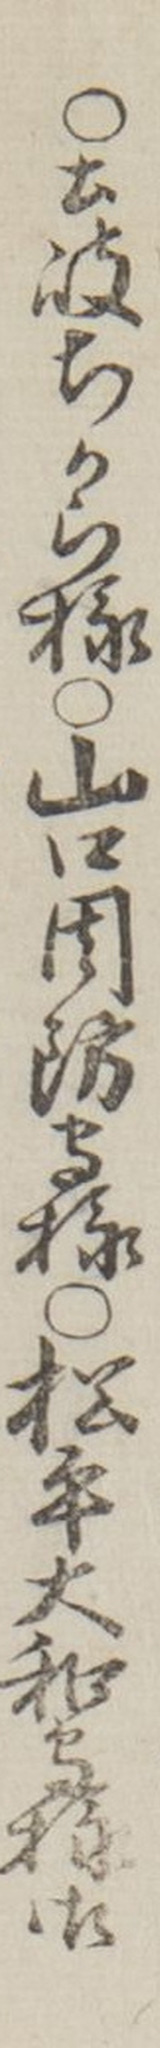○土岐ちから様○山口周防守様○松平大和守様御
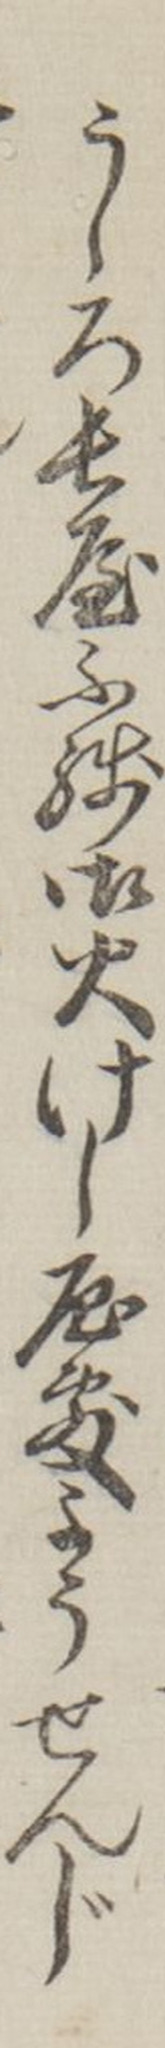うしろ長屋不残御火けし屋敷ようせんじ
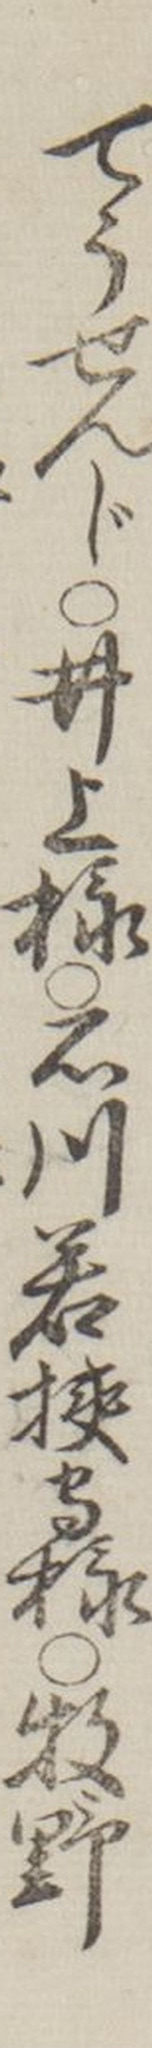てうせんじ○井上様○石川若狭守様○牧野
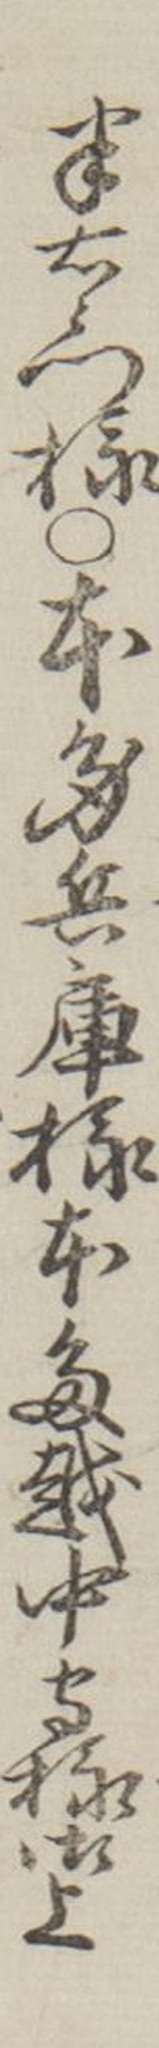半右衛門様○本多兵庫様本多越中守様御上
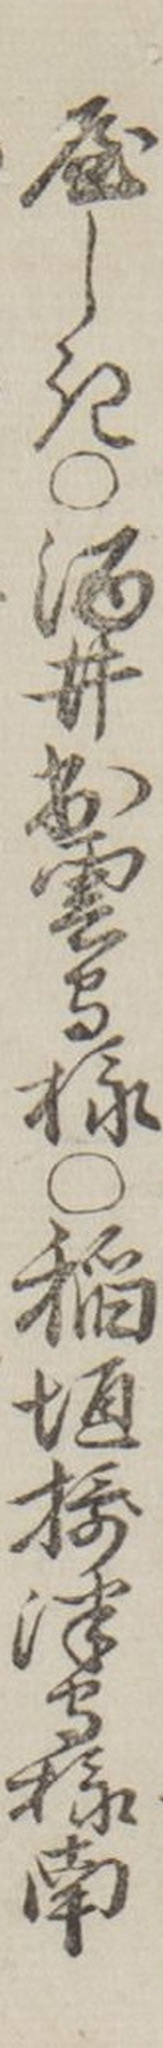屋しき○酒井出雲守様○稲垣摂津守様南
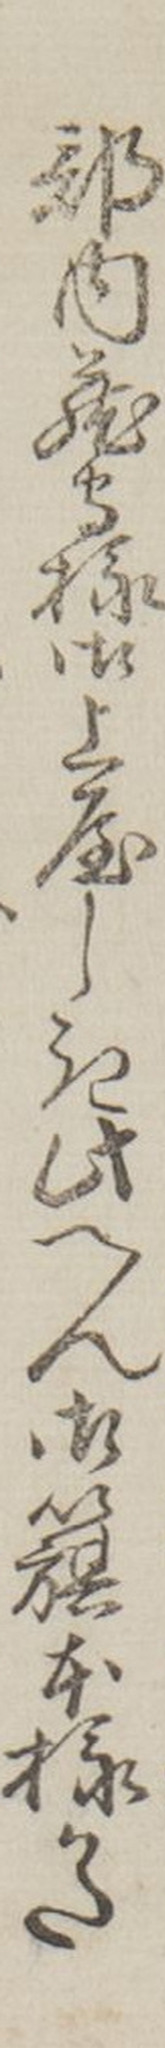部内蔵守様御上屋しき此へん御簱本様かた
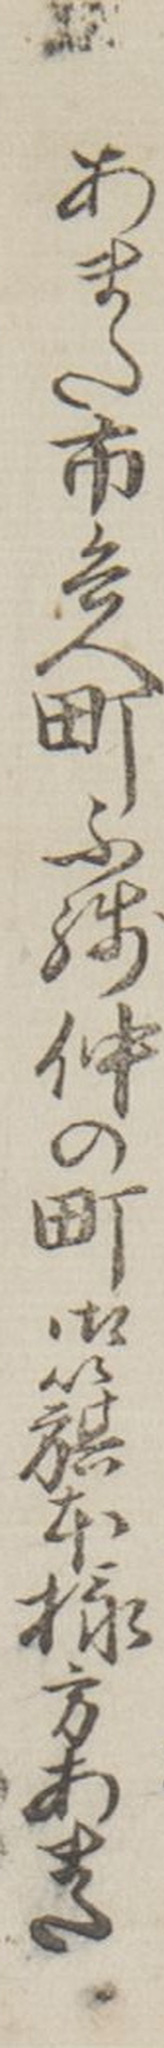あまた市谷人町不残仲の町御簱本様方あまた
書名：るいせう道しるベ　上・中・下
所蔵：あいおいニッセイ同和損保株式会社
